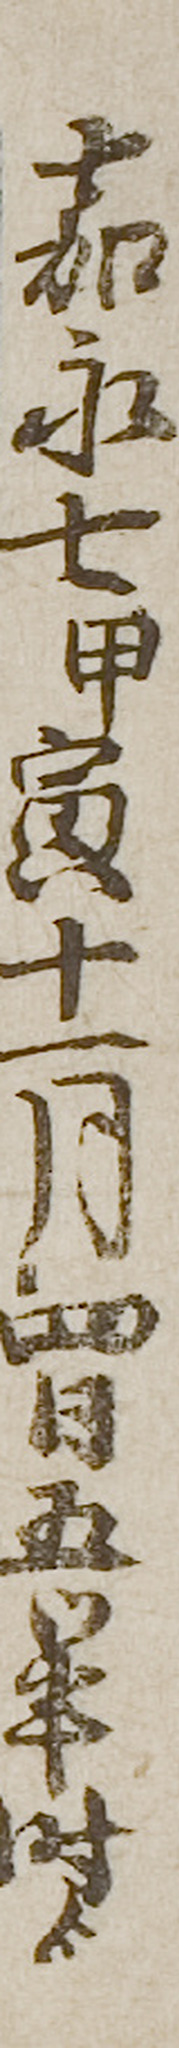嘉永七甲寅十一月四日五ツ半時ゟ
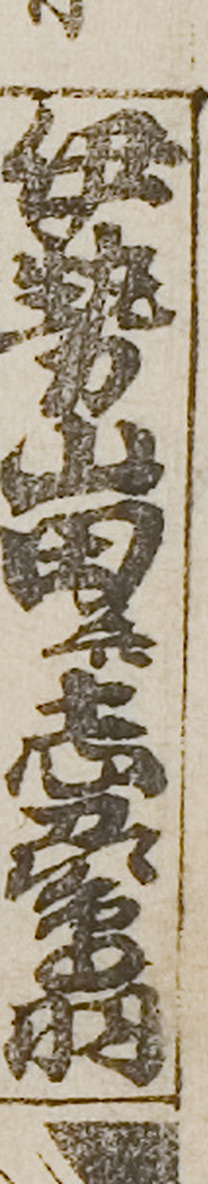伊勢山田并志州鳥羽
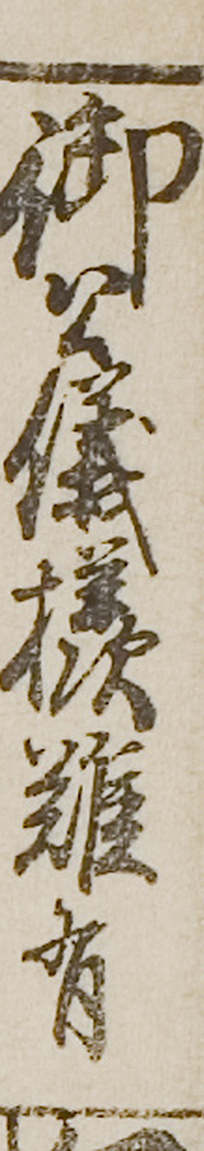御公儀様難有
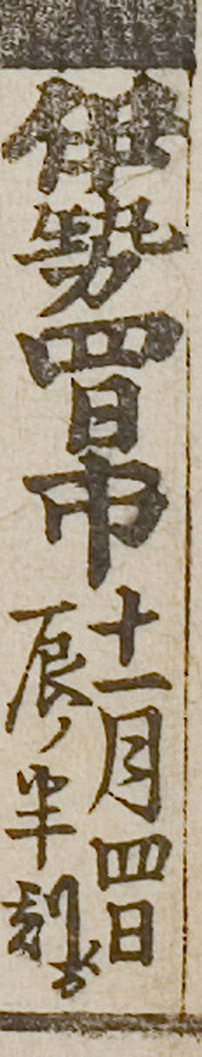伊勢四日市十一月四日辰ノ半刻ゟ
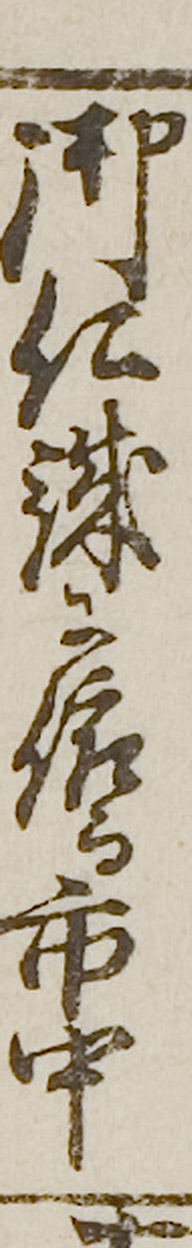御仁誠に依而市中
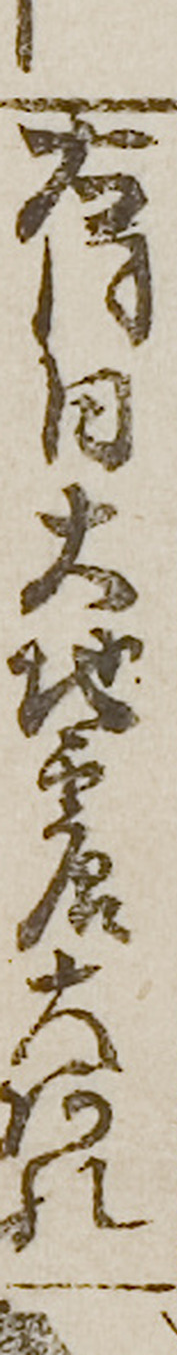右同日大地震大あれ
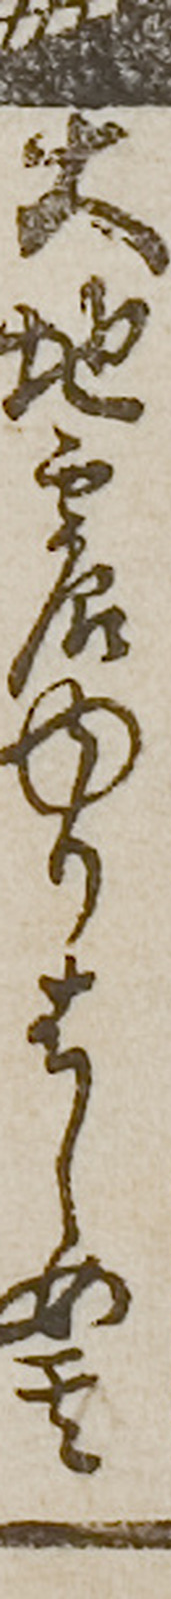大地震ゆりはしめ其
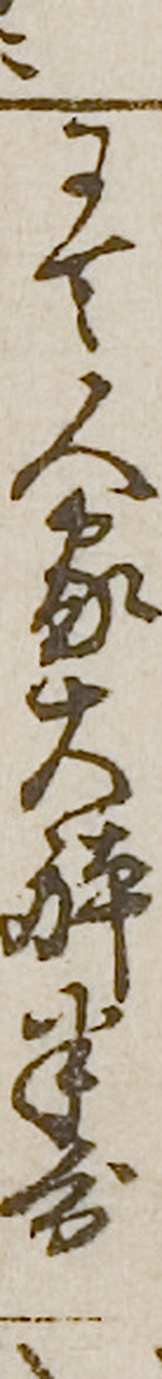にて人家大躰半分
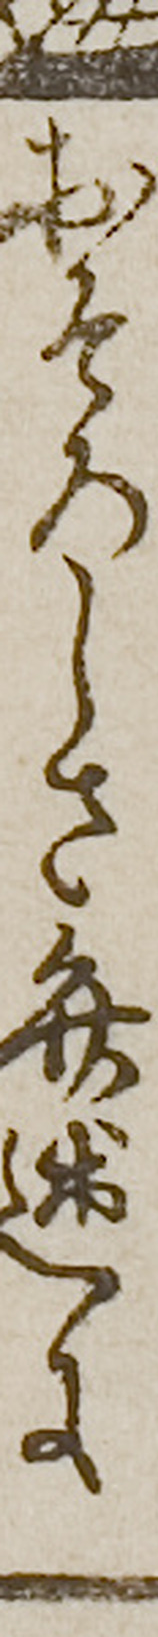おそろしさ弁述に
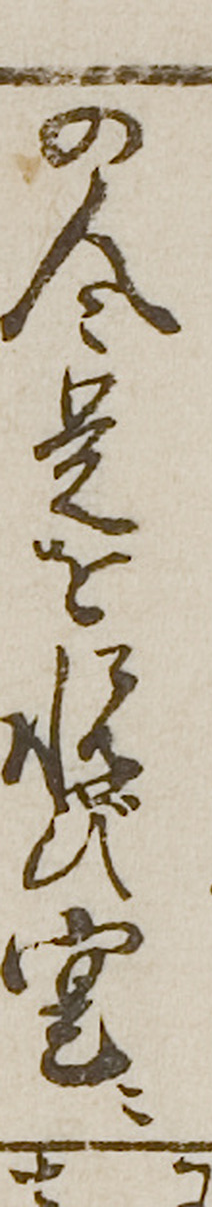の人々是を悦び寔に
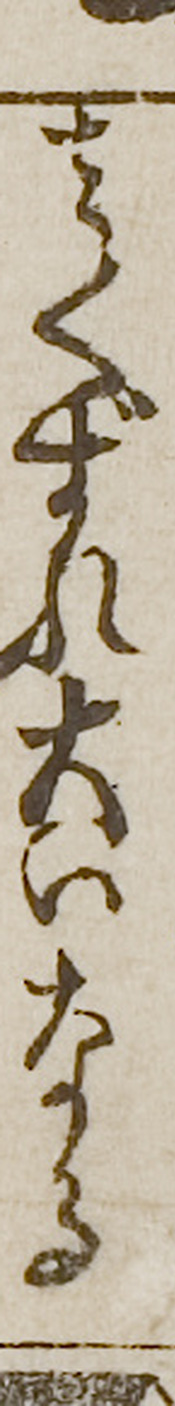はくずれ大いなる
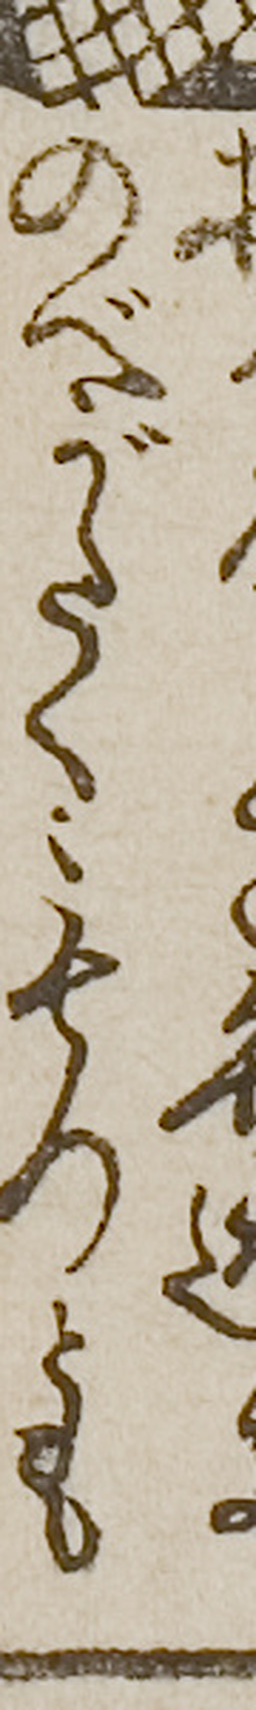のべがたくもつとも
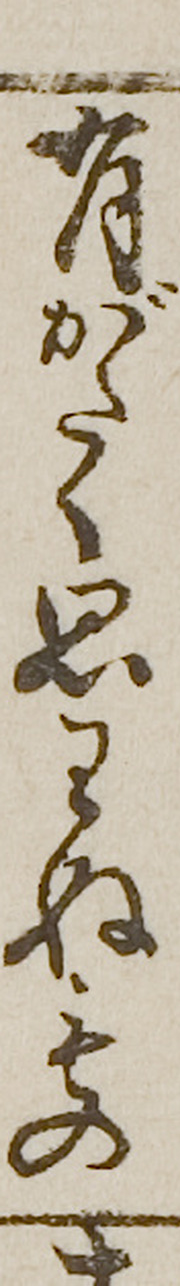有がたく思わぬもの
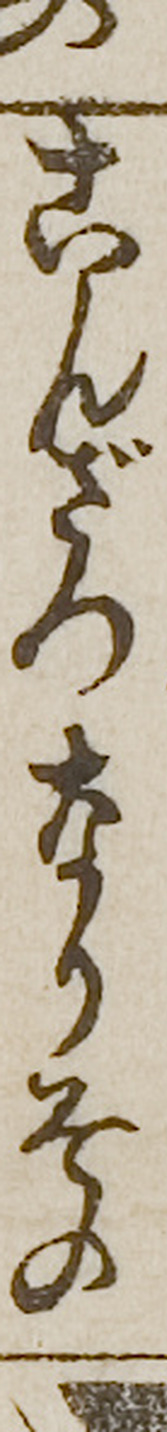こんざつなりその
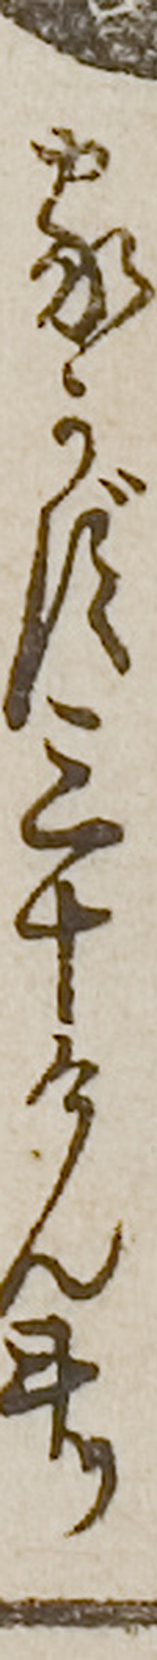家かず三十けん計り
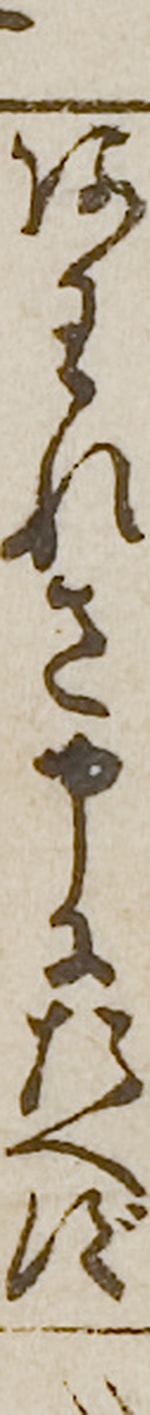あわれさ申にたへず
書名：諸国大地震大津波 三編
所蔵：東京大学総合図書館 General Library in the University of Tokyo, JAPAN
